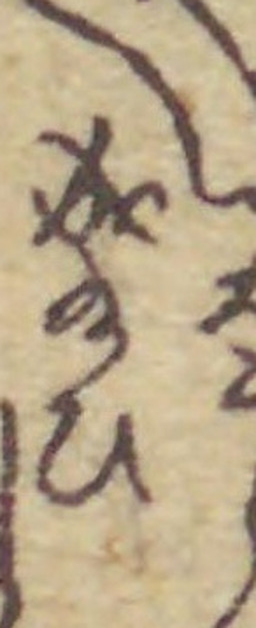成給ひしそ
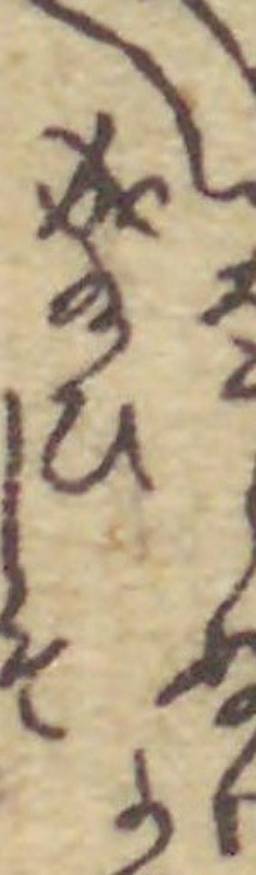成給ひしそ
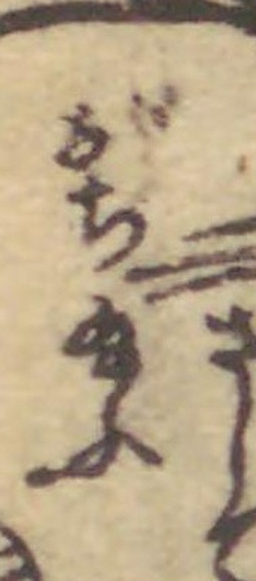おち給ふ
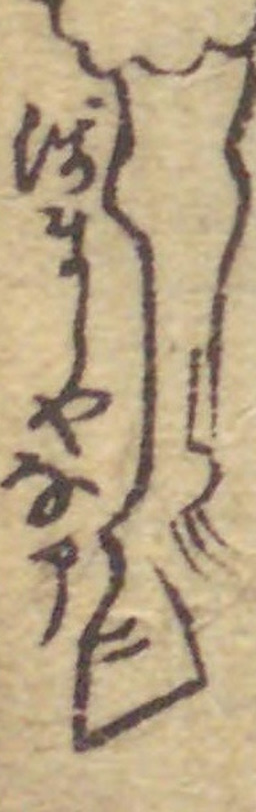浅ましやなア

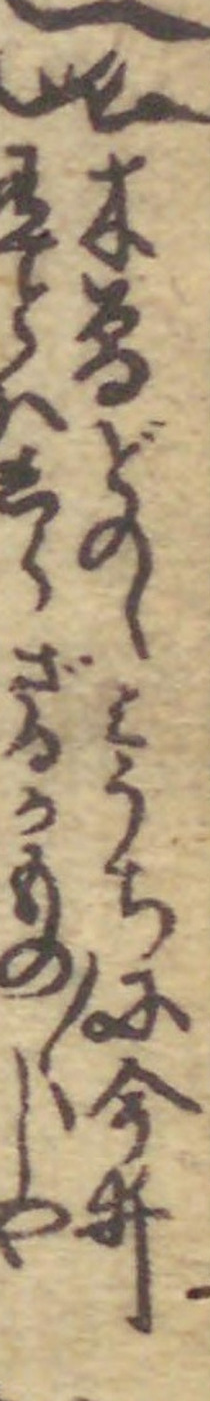木曽どのゝみうちに今井
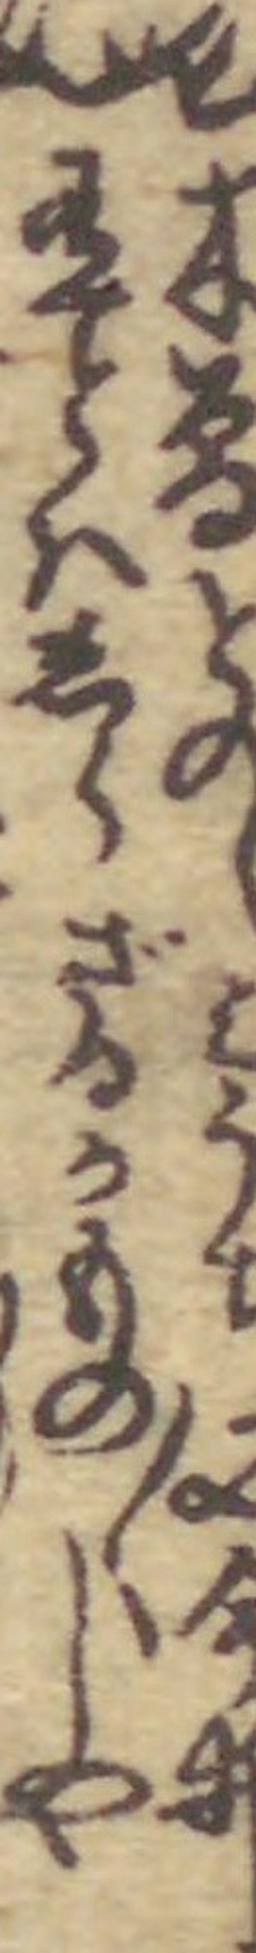有とはしらざるかもの〳〵しや
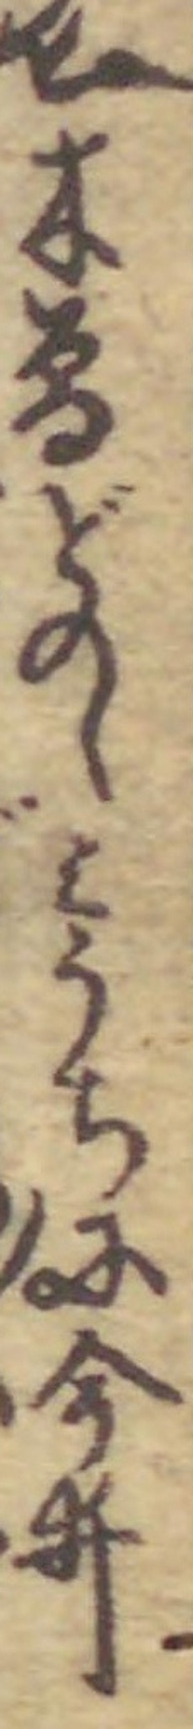木曽どのゝみうちに今井
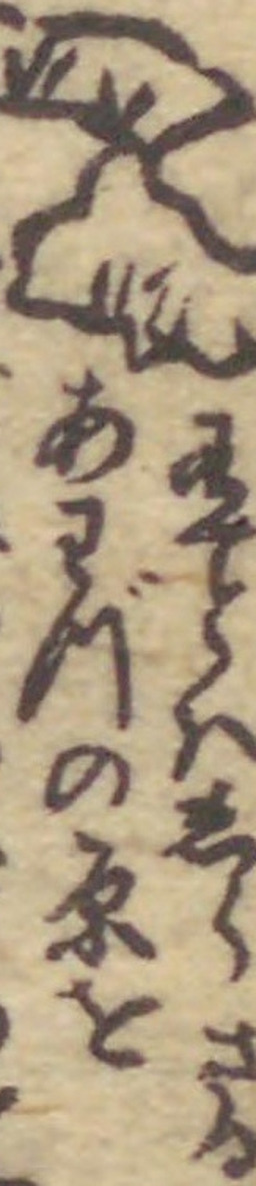あわづの原を
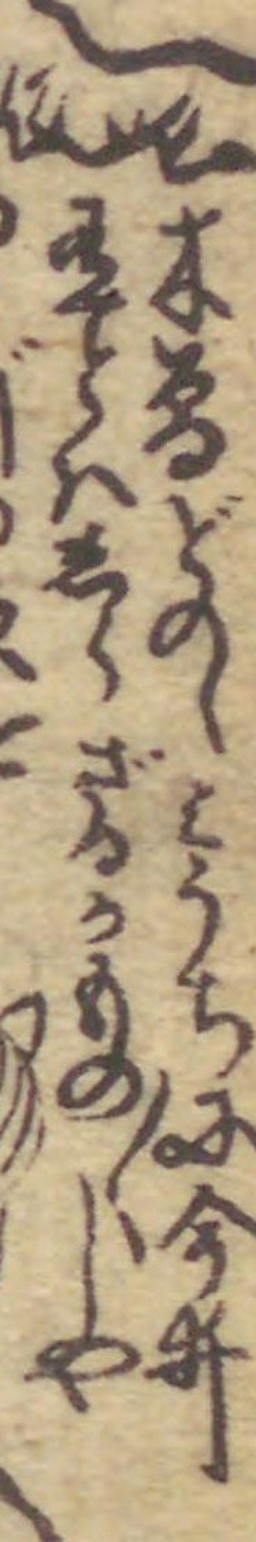有とはしらざるかもの〳〵しや
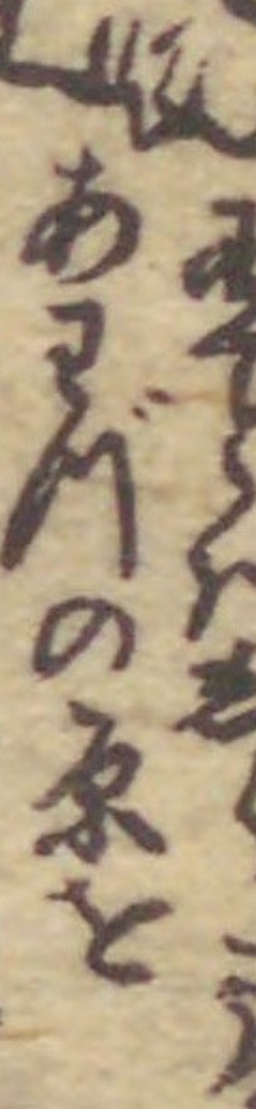あわづの原を
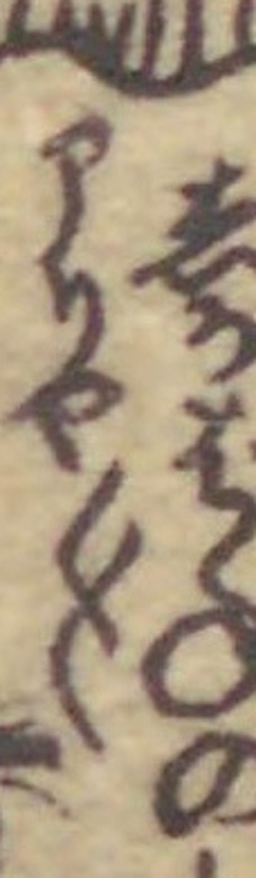アリヤ〳〵〳〵
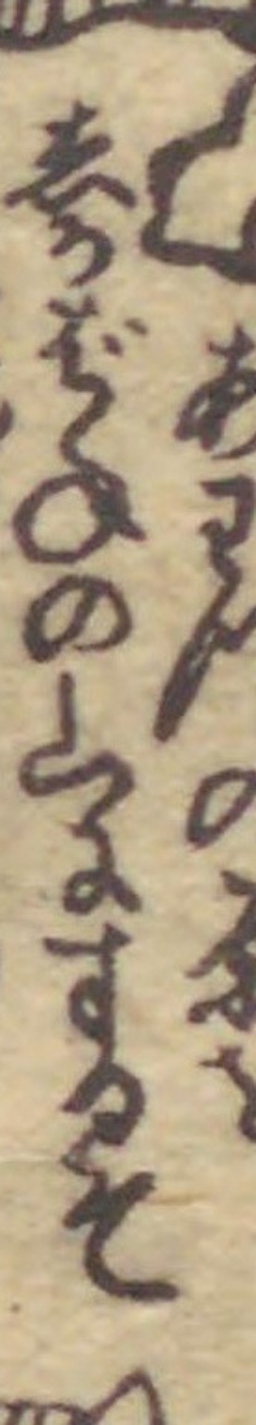しかばねの山にするそ
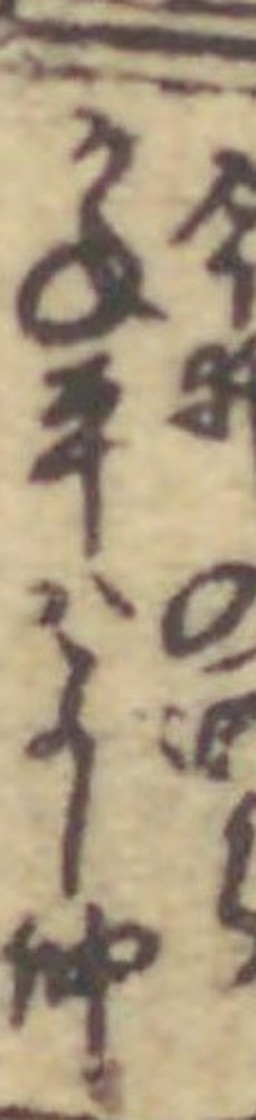かね平はよし仲
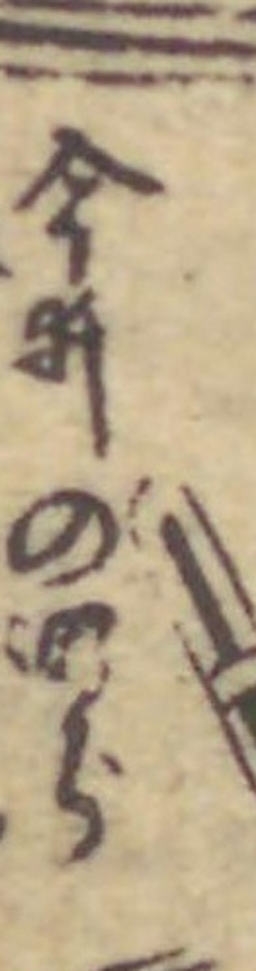今井の四郎
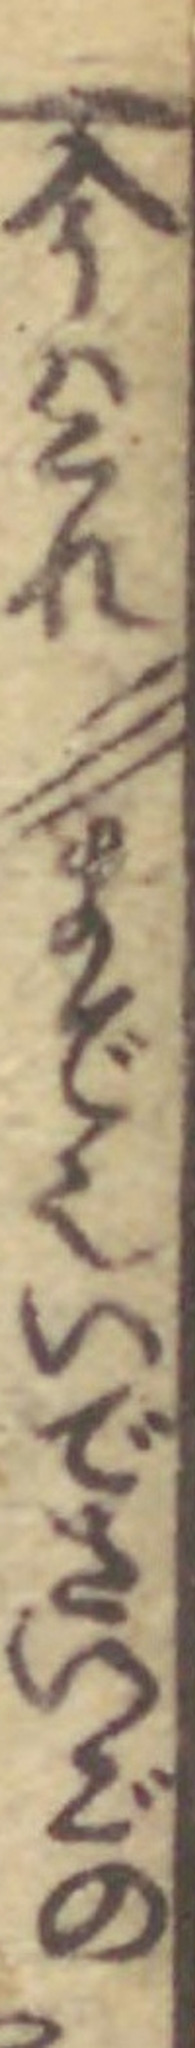今はこれまで也いでさいごの
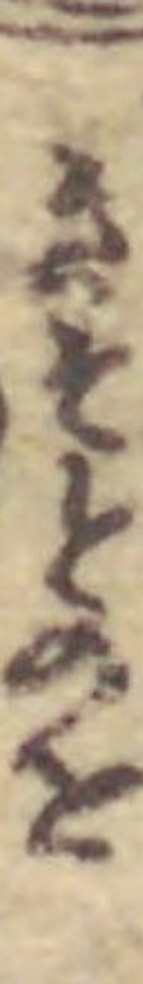きそとのを
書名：朝比奈草摺実記 2巻
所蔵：国立国会図書館 National Diet Library, JAPAN
